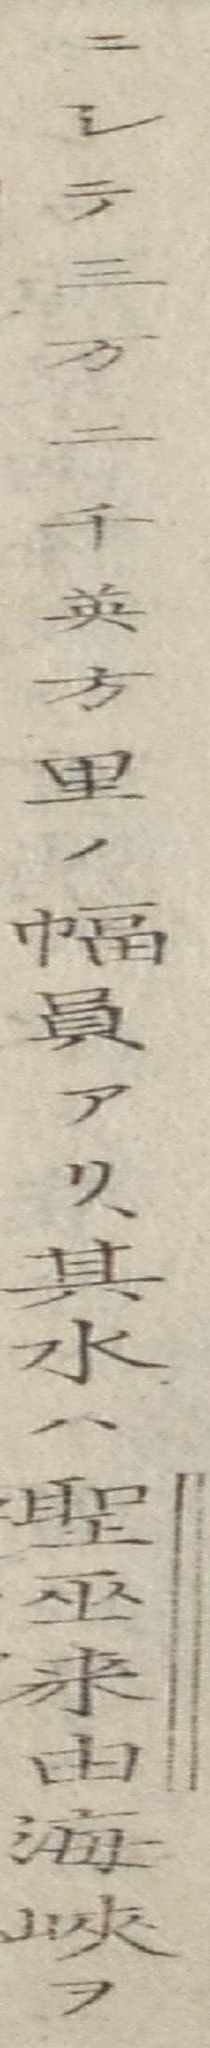ニシテ三万二千英方里ノ幅員アリ、其水ハ聖巫来由海峡ヲ
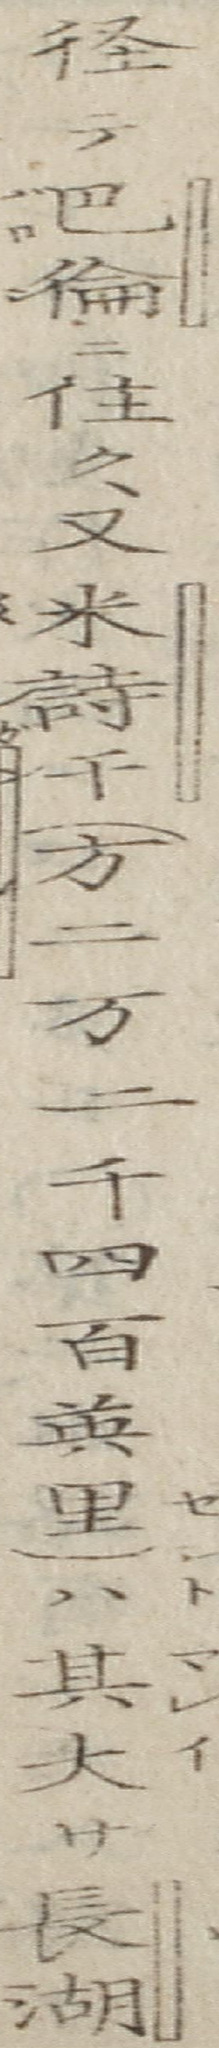径テ巴倫ニ住ク、又米詩干ハ其大サ長湖
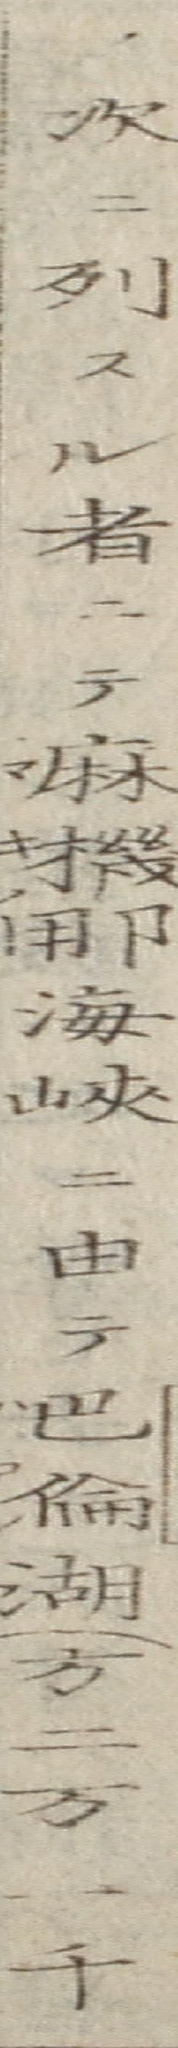ノ次ニ列スル者ニテ麻機那海峡ニ由テ巴倫湖（方二万一千
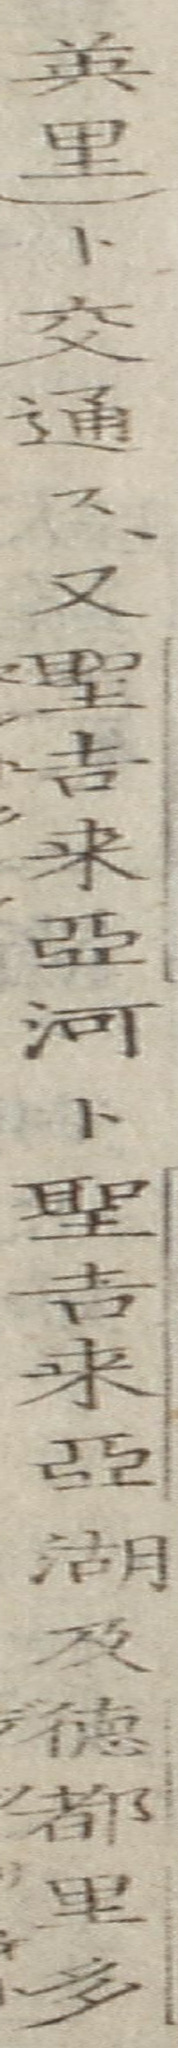英里）ト交通ス、又聖吉来亜河ト聖吉来亜湖及び徳都里多
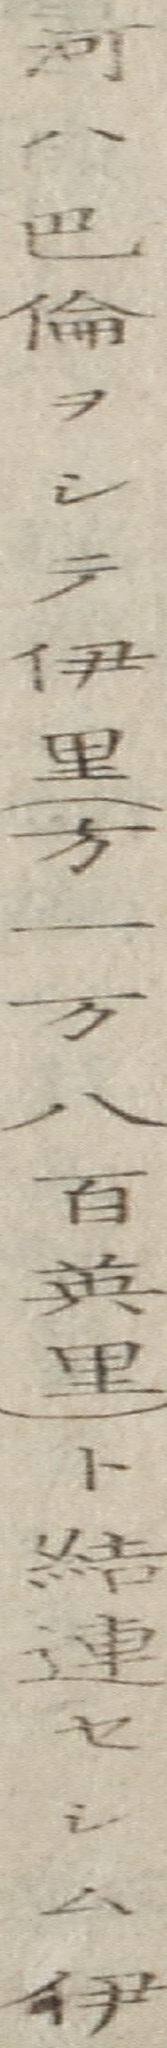河ハ巴倫ヲシテ伊里ト結連セシム伊
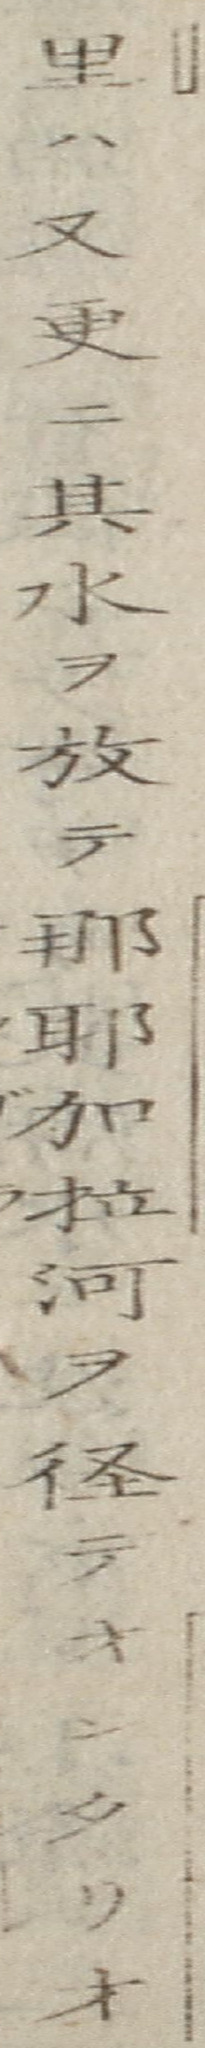里ハ又更ニ其水ヲ放テ那耶加拉河ヲ径テオンタリオ
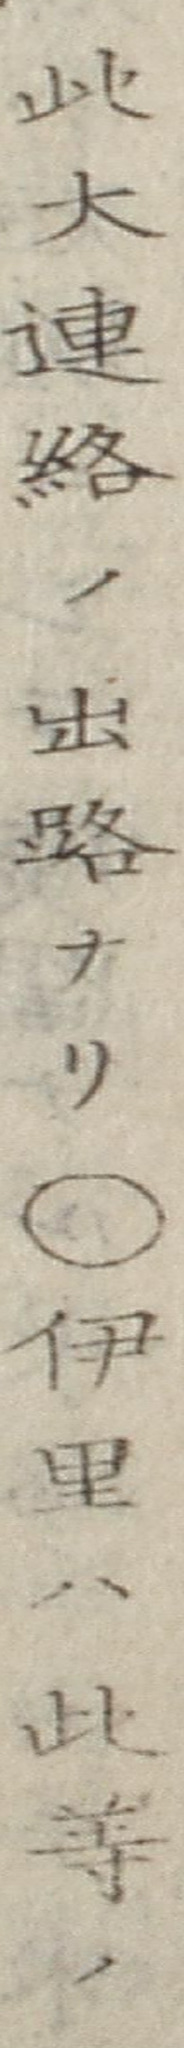此大連絡ノ出路ナリ○伊里ハ此等ノ
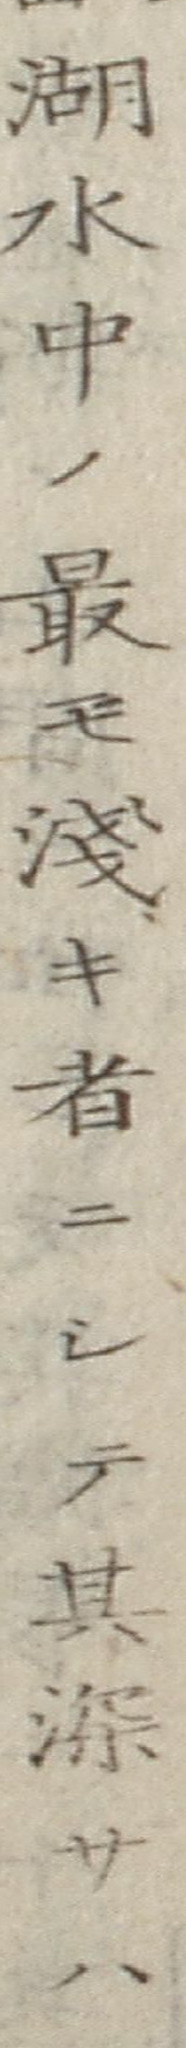湖水中ノ最モ浅キ者ニシテ其深サハ
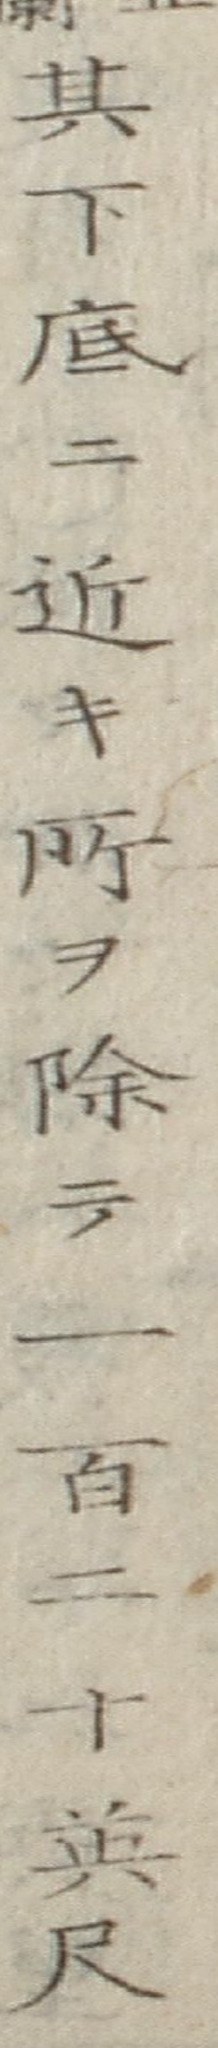其下底ニ近キ所ヲ除テ一百二十英尺
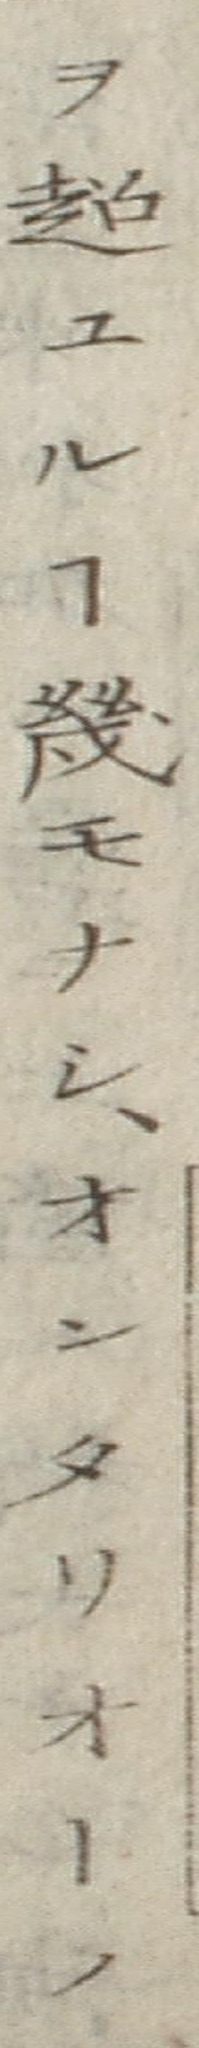ヲ超ユルヿ幾モナシ、オンタリオーノ
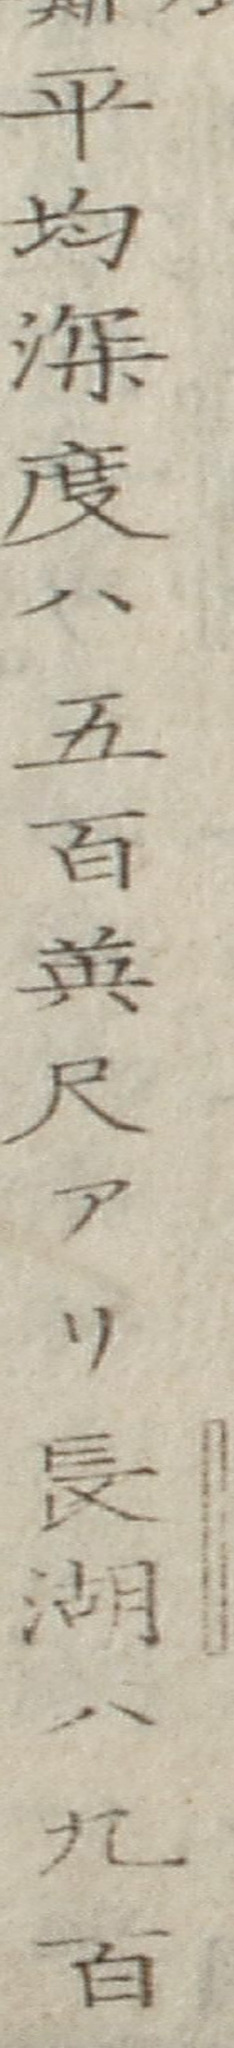平均深度ハ五百英尺アリ長湖ハ九百
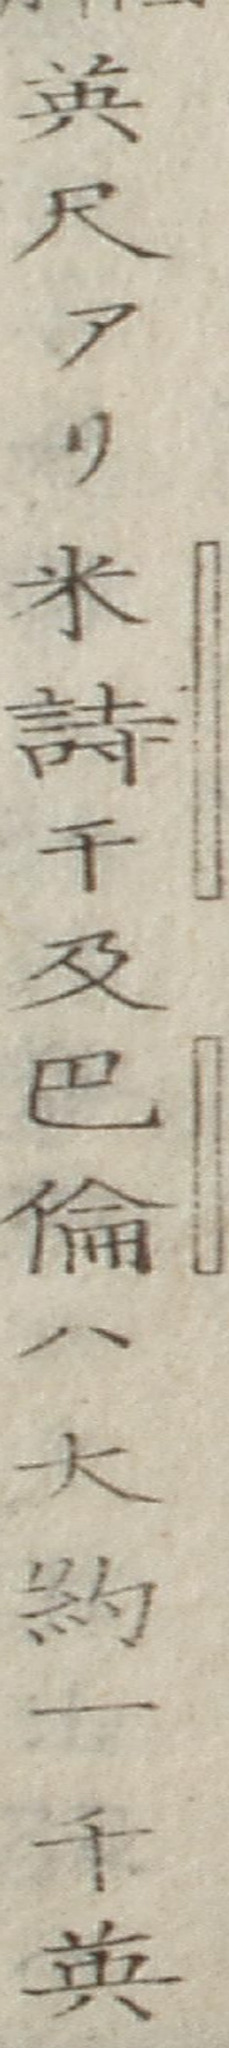英尺アリ米詩干及巴倫ハ大約一千英
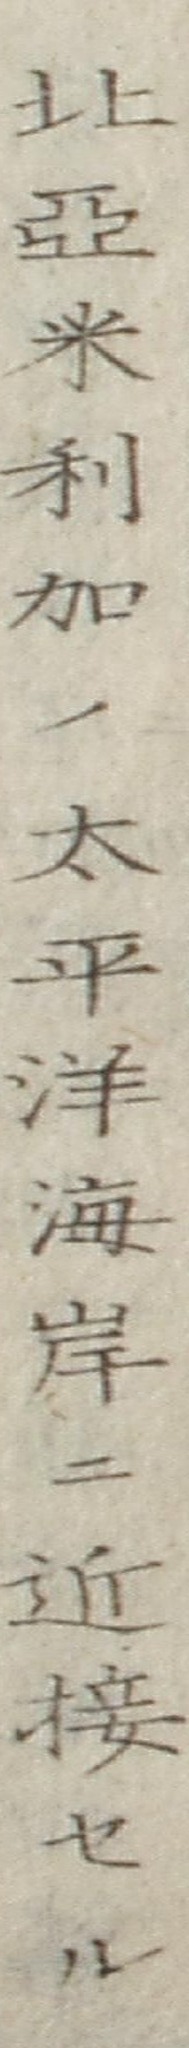北亜米利加ノ太平洋海岸ニ近接セル
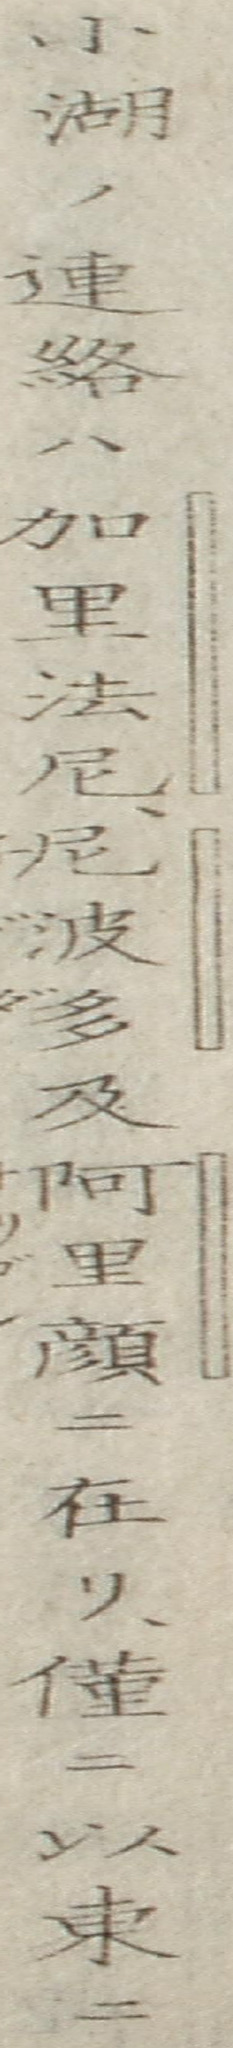小湖ノ連絡ハ加里法尼、尼波多及阿里顔ニ在リ、僅ニ以東ニ
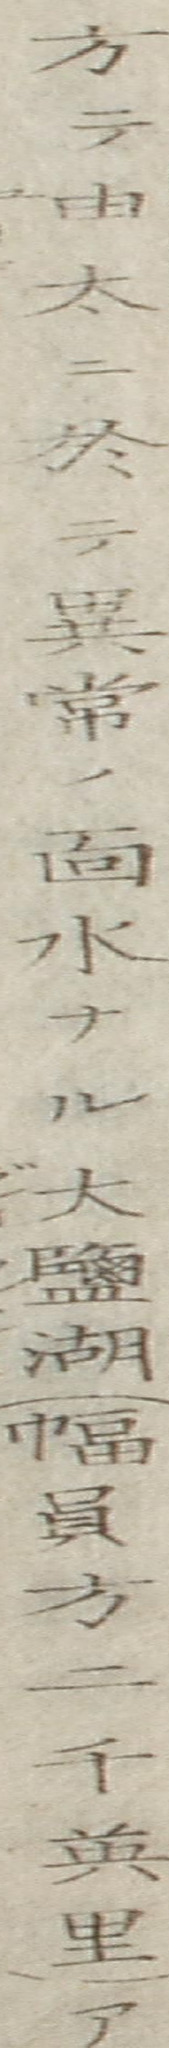方テ由太ニ於テ異常ノ面水ナル大塩湖ア
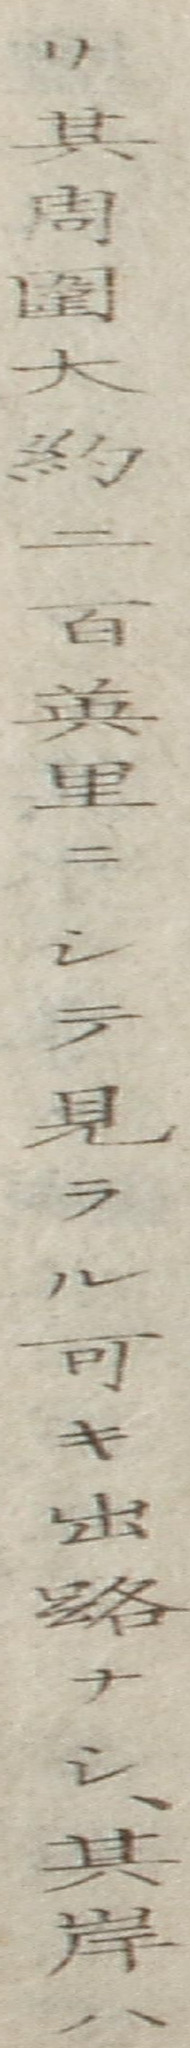リ其周囲大約二百英里ニシテ見ラル可キ出路ナシ、其岸ハ
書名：地形論　巻二
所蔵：東京大学地震研究所図書室 Earthquake Research Institute Library, The University of Tokyo, JAPAN
